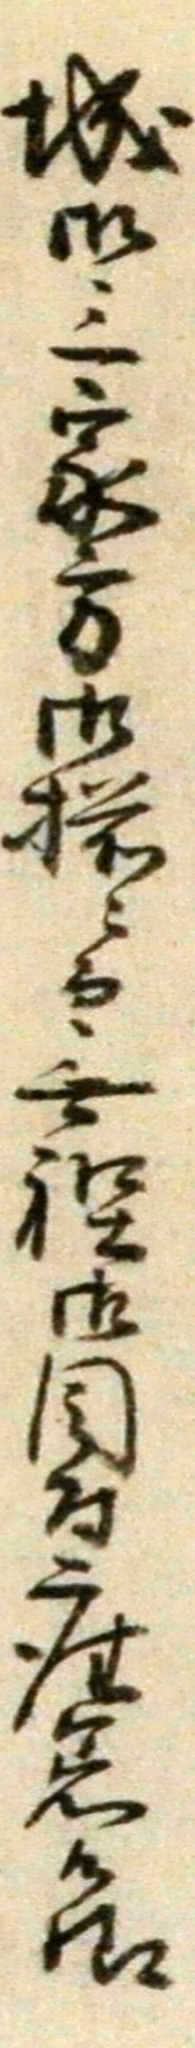城御三家方御揃ニ而無程御目付座着候様
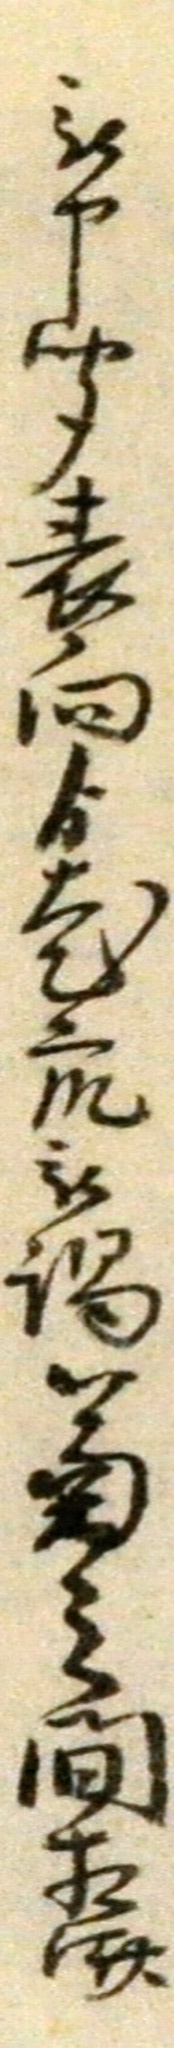被申聞表向ゟ老衆被謁菊之間相済
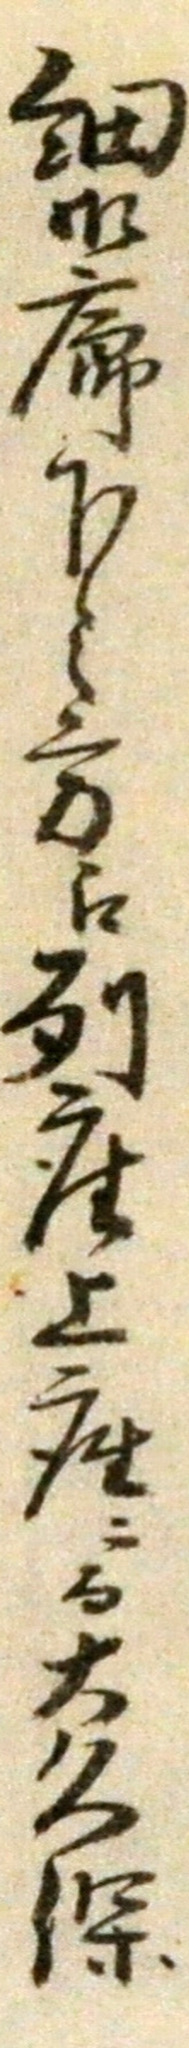細御廊下之方え列座上座ニ而大久保
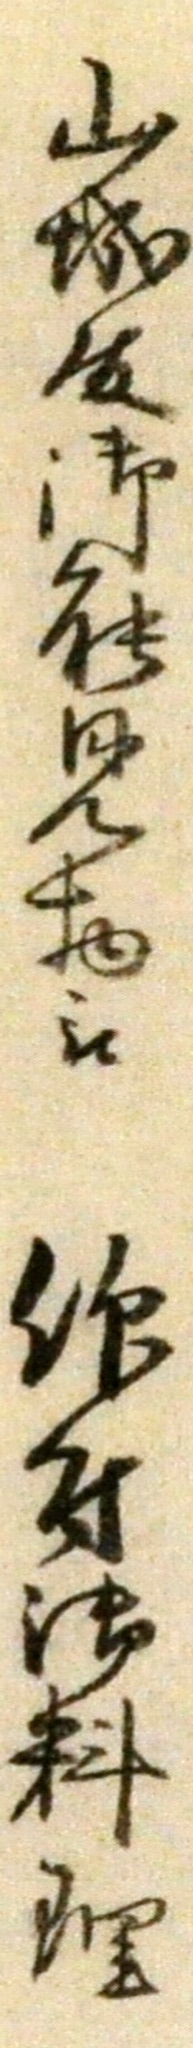山城殿御能見物被仰付御料理
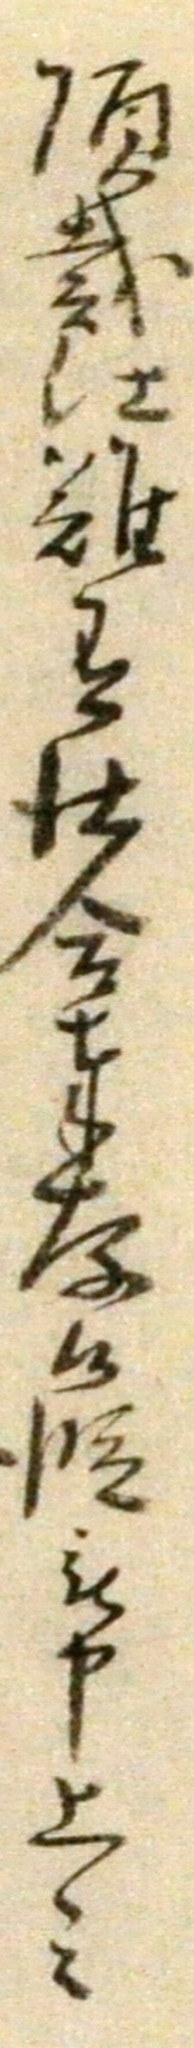頂戴仕難有仕合奉存候段被申上候
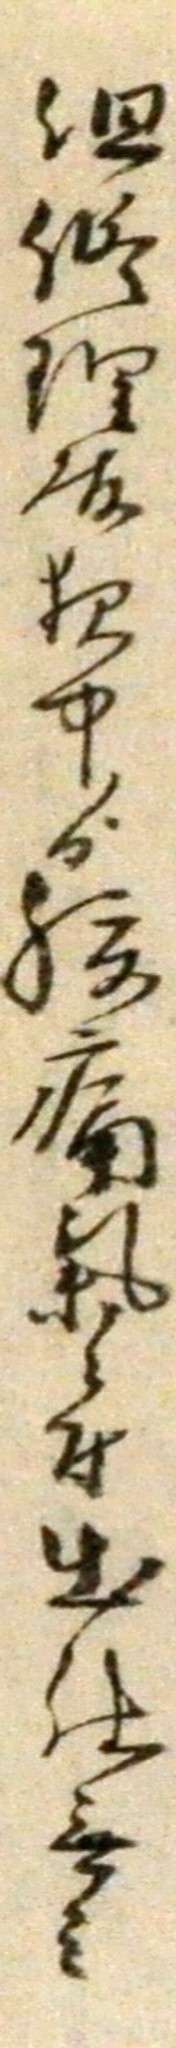但修理殿夜中ゟ腹痛気ニ付出仕無之
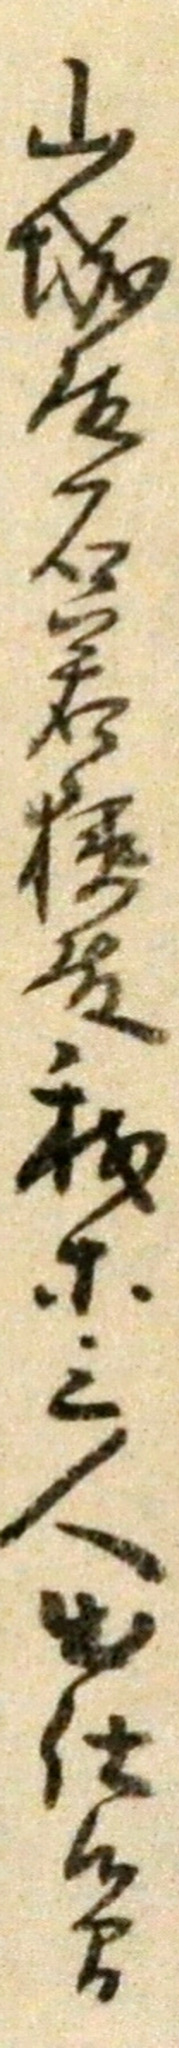山城殿石若狭殿我等三人出仕候間
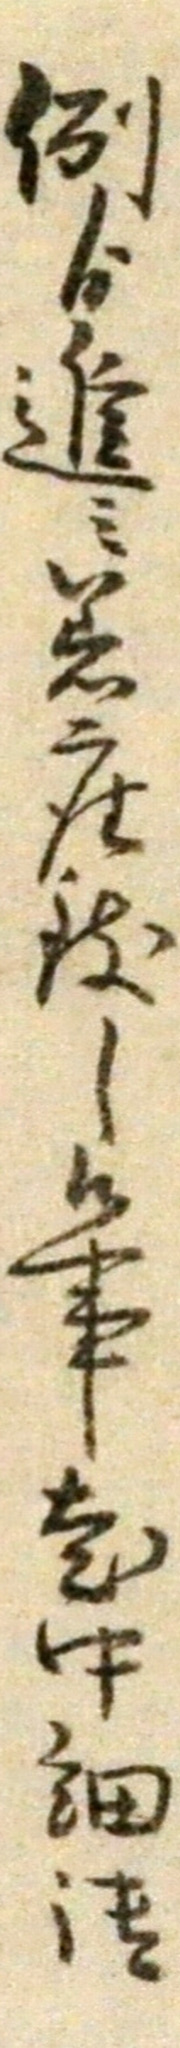例ゟ進ミ着座致し候事老中細御
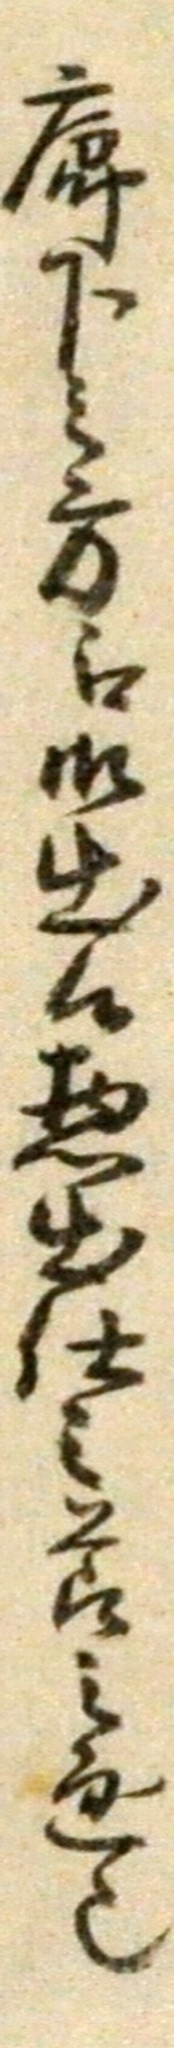廊下之方え御出候惣出仕之節之通也
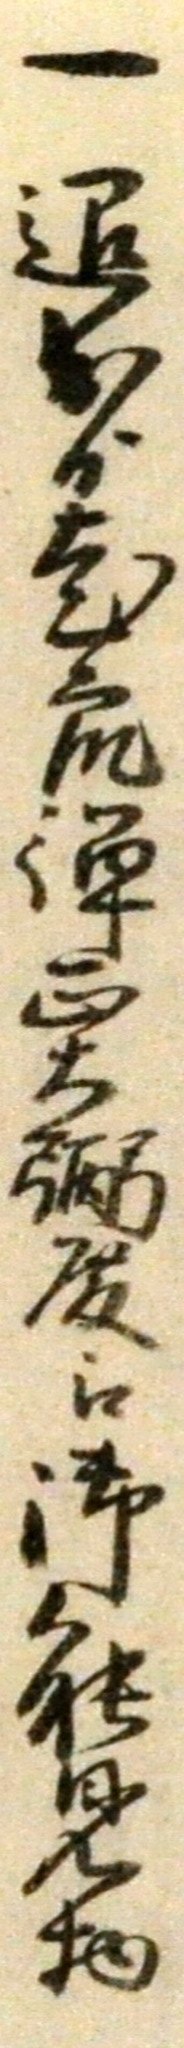一退出ゟ老衆弾正大弼殿え御能見物
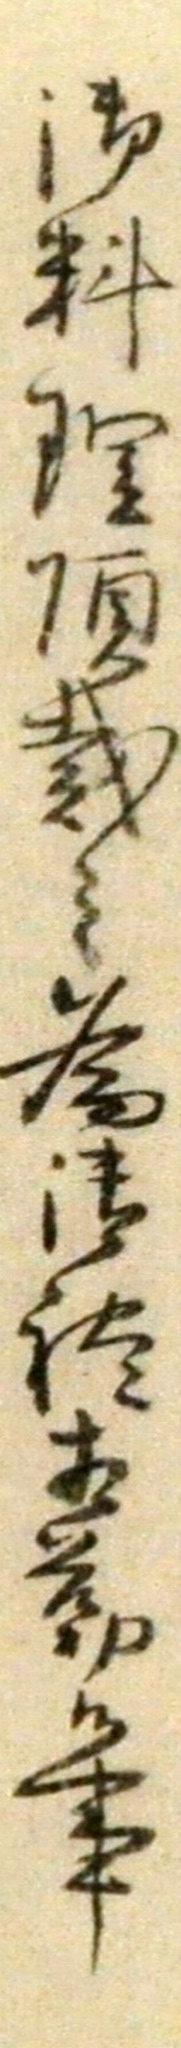御料理頂戴之為御禮相勤候事
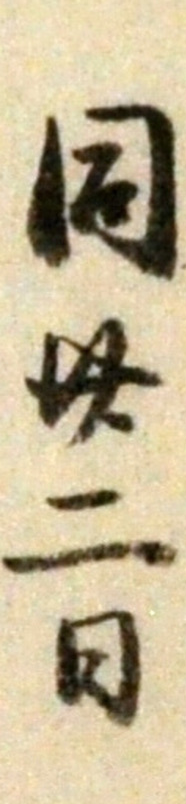同廿一日

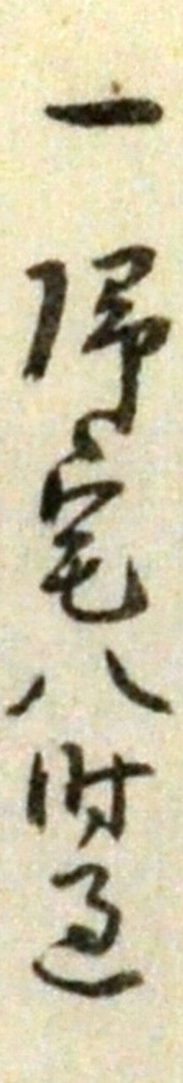一帰宅八時過
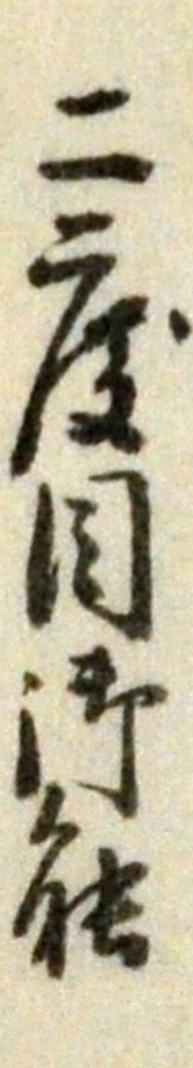二度目御能
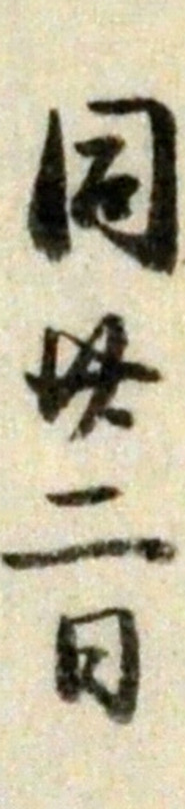同廿二日
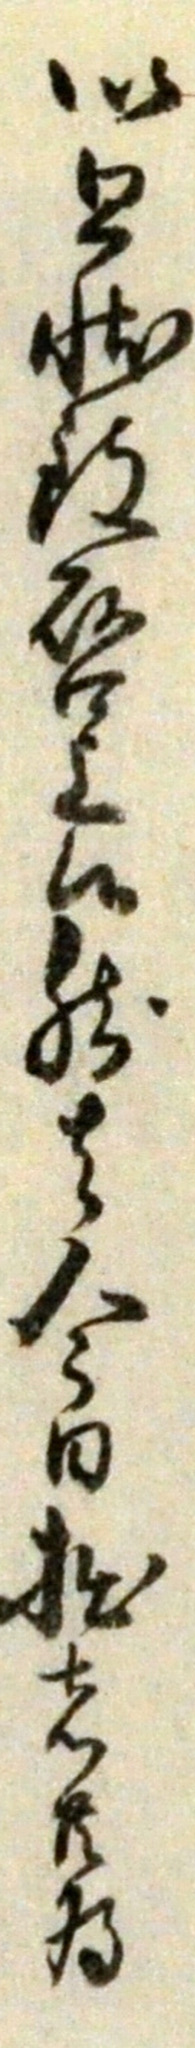以廻状致啓上候然は今日拙者共為
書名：若君様（家斉嫡男）誕生諸祝儀ノ節ノ留書外
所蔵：伊那市立高遠町図書館・合同会社AMANE
